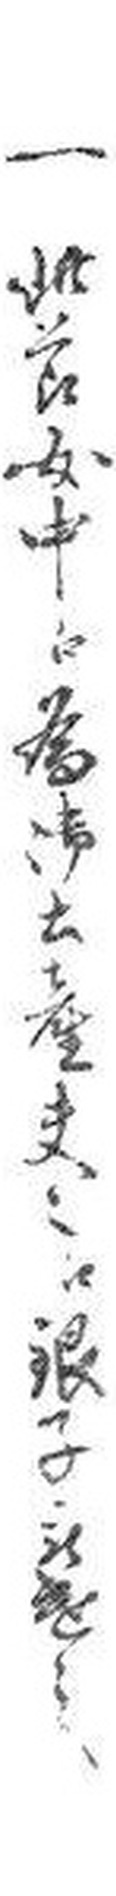一此節女中江為御土産夫々江銀子被遣之
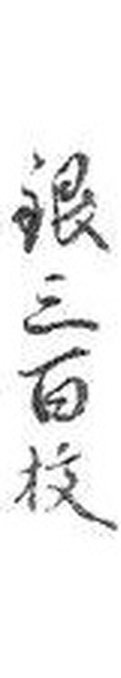銀三百枚
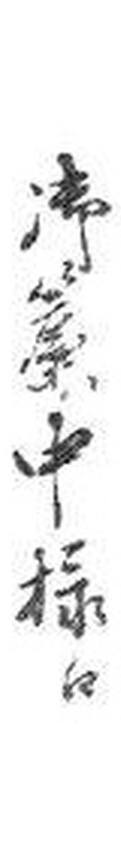御簾中様江
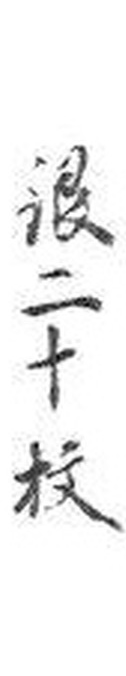銀二十枚
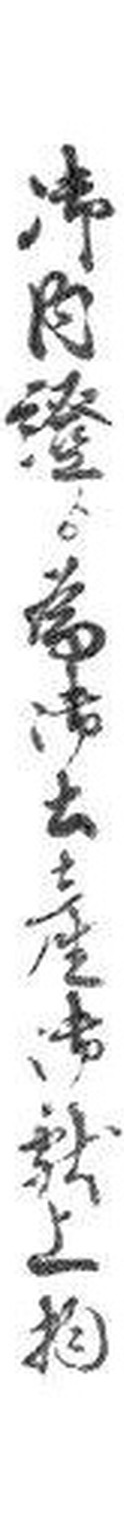御内証ゟ為御土産御献上物
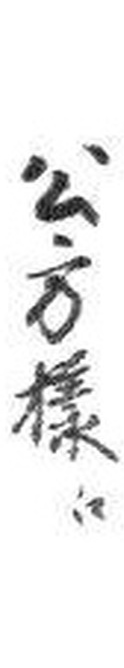公方様江
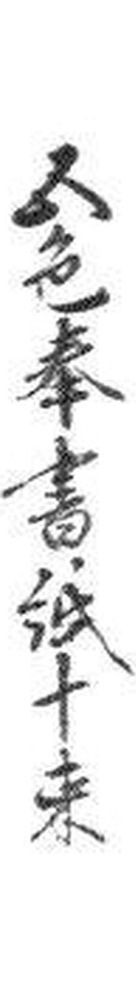五色奉書紙十束
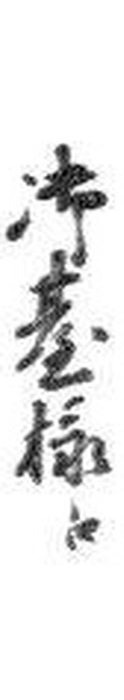御台様江
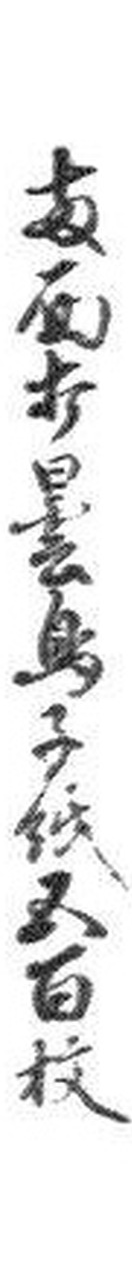両面打曇鳥子紙五百枚
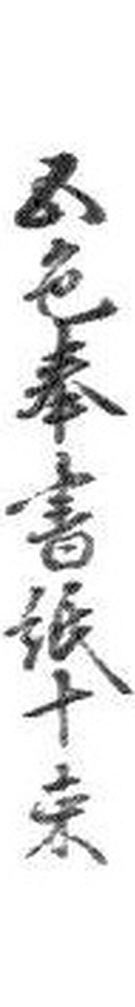五色奉書紙十束
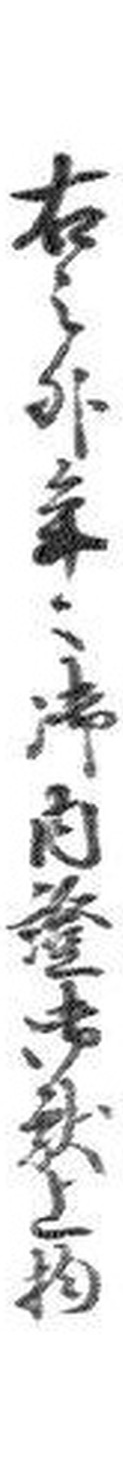右之外年々御内証御献上物

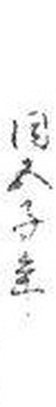同五子年
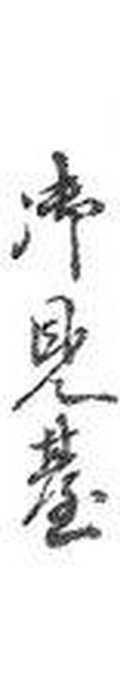御見台
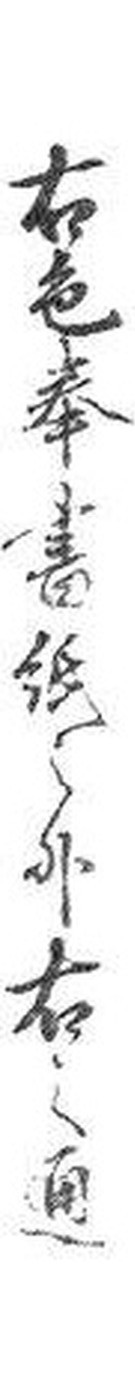右色奉書紙之外右之通
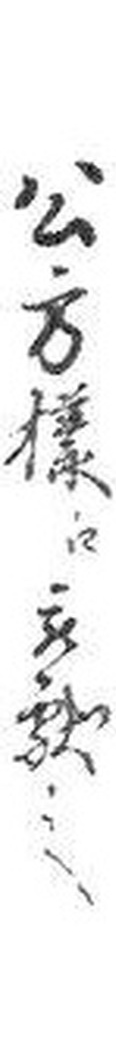公方様江被献之
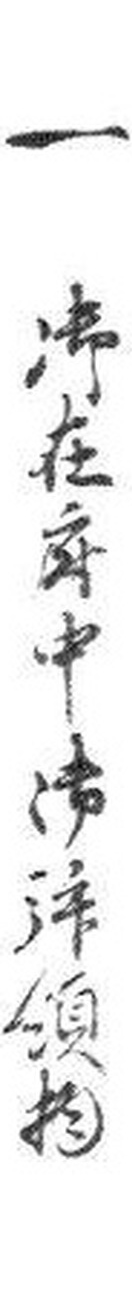一御在府中御拝領物
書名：家譜 二十六 吉品公 従宝永七年到正徳二年
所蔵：福井県文書館 Fukui Prefectural Archives
